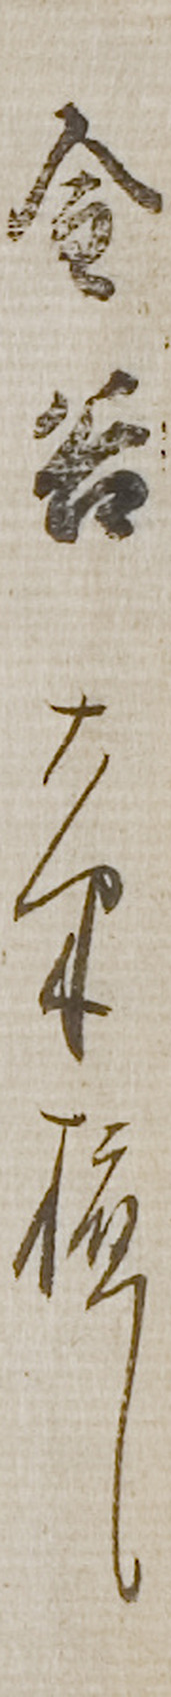金谷大半損候
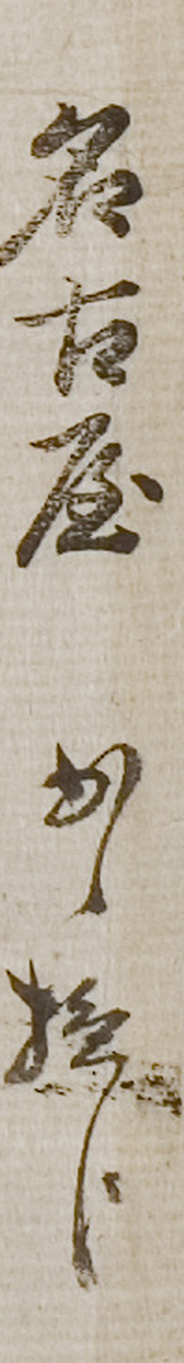名古屋少々損じ
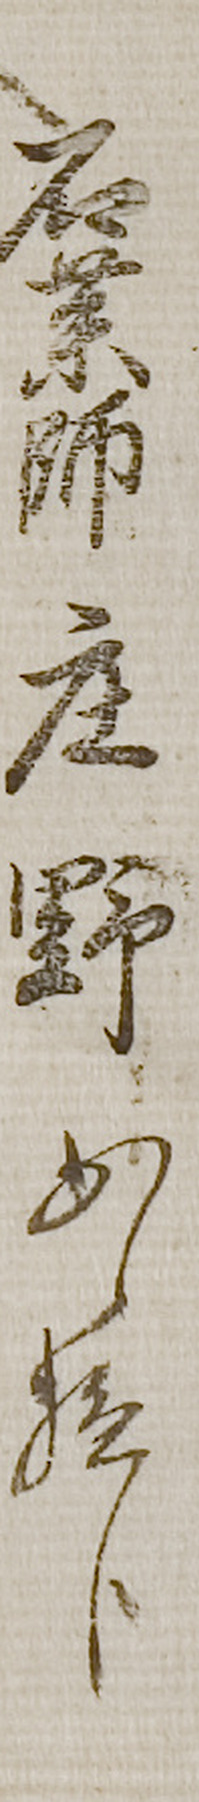石薬師庄野少々損じ
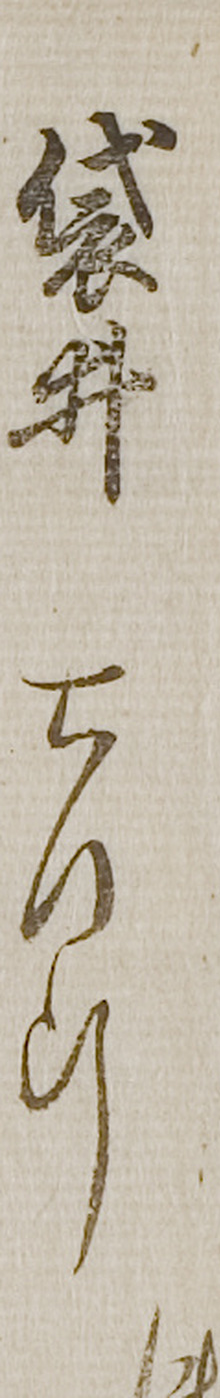袋井右同断
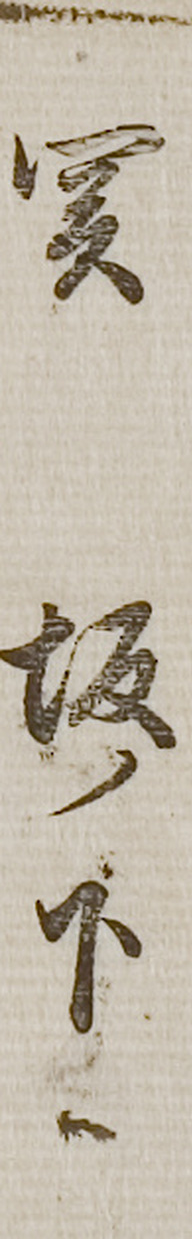関坂ノ下〃
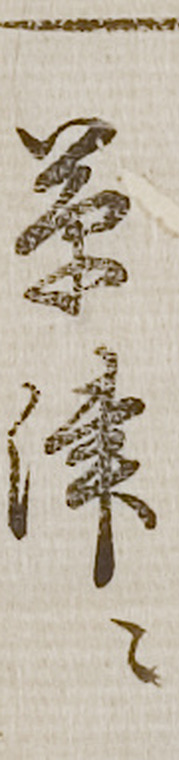草津々
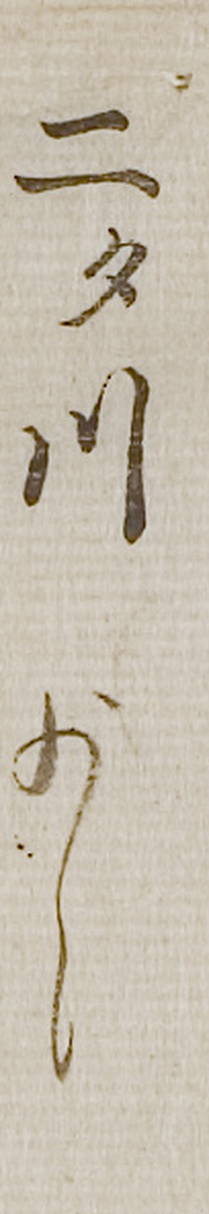二タ川少々
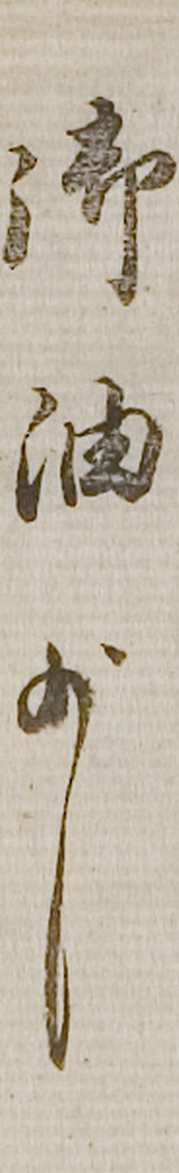御油少々
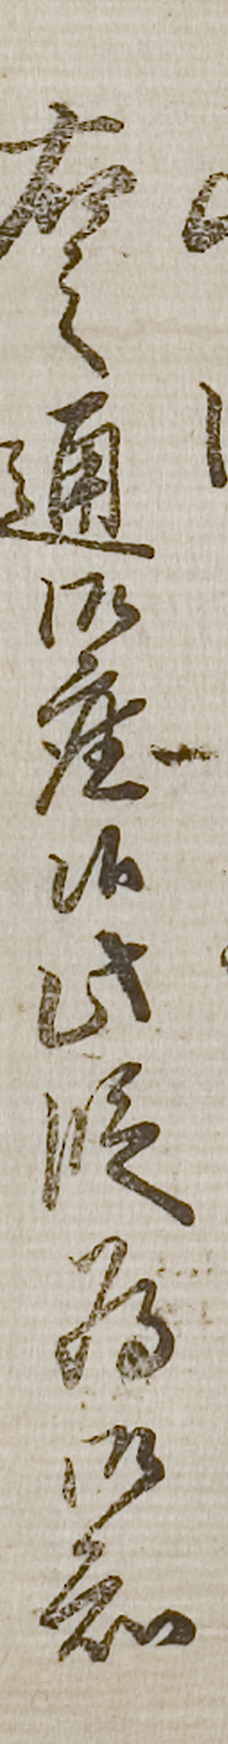右之通御座候此段為御知
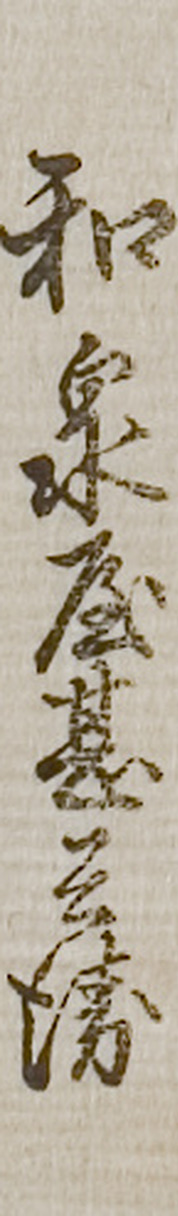和泉屋甚兵衛
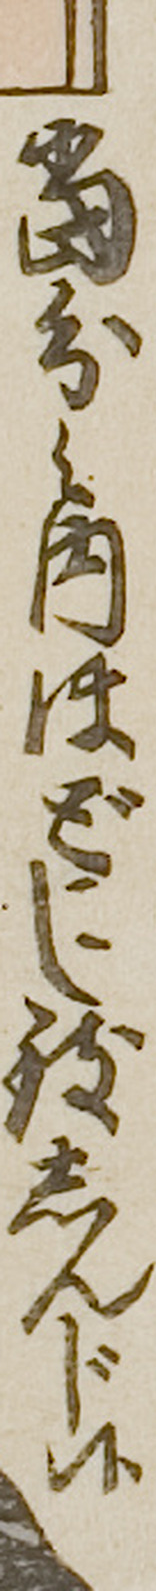当分之内ほどこし致しんじ候
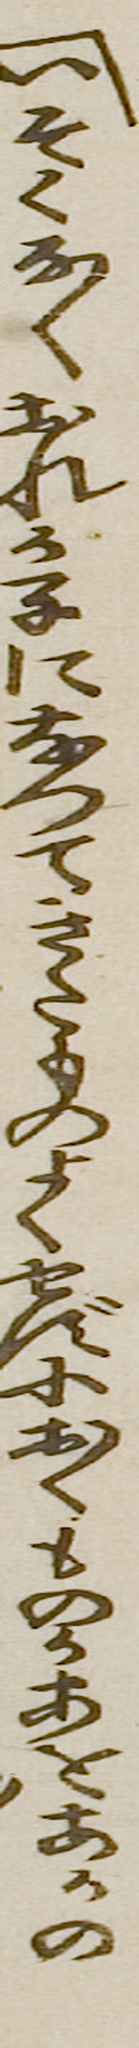ゑんま「いそくな〳〵おれか子になつてきたものよくせずにおくものかあをあかの
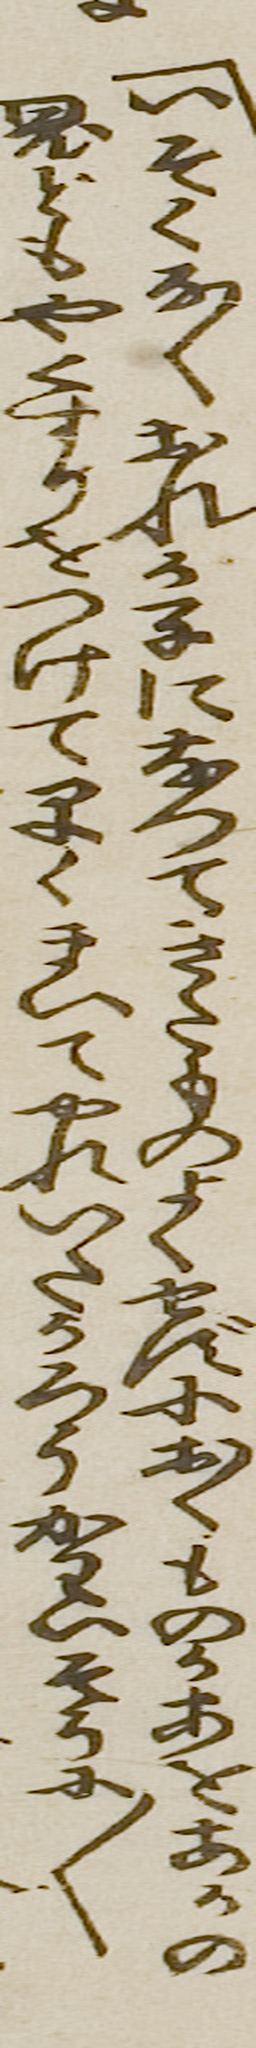鬼どもやくすりをつけて早くまいてやれいたかろうかわいそうに〳〵
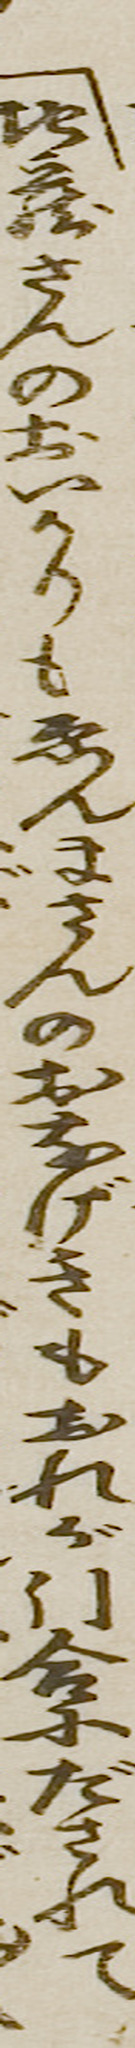しやうつか「地蔵さんのおいかりもゑんまさんのおなげきもおれが引合にだされて
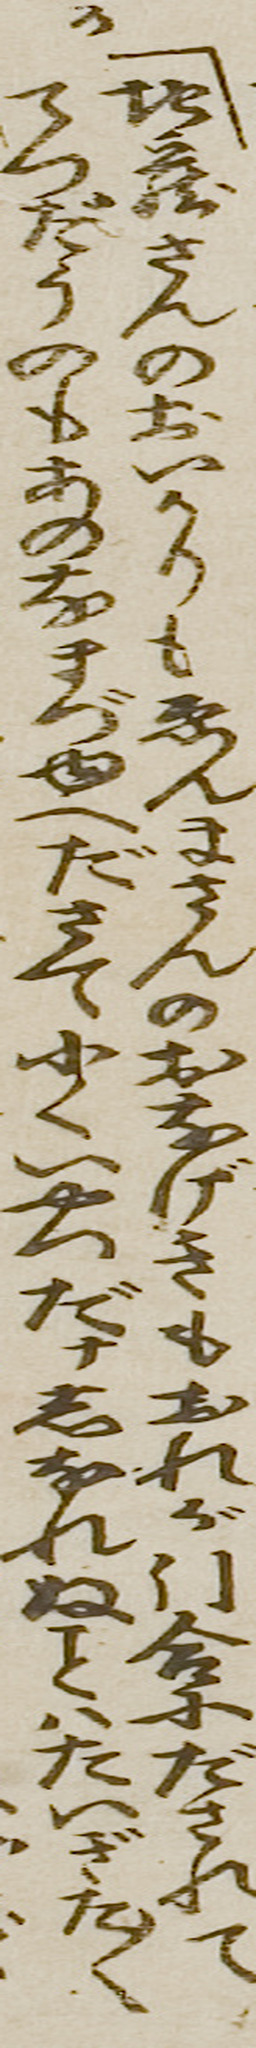てつだうのもあのなまづゆへださてにくいやつだナしなれぬことはたいぎた〳〵
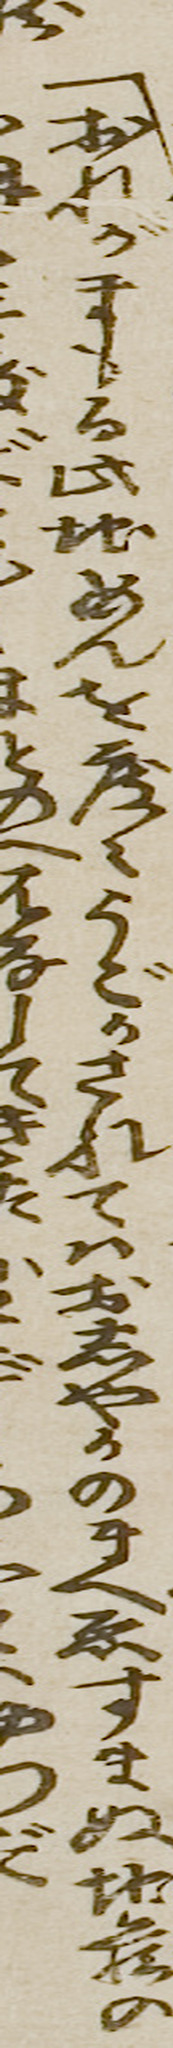地蔵「おれがまもる此地めんを度々うごかされてはおしやかのまへゑすまぬ地蔵の
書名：[東海道宿場震災状況]
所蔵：東京大学総合図書館 General Library in the University of Tokyo, JAPAN
